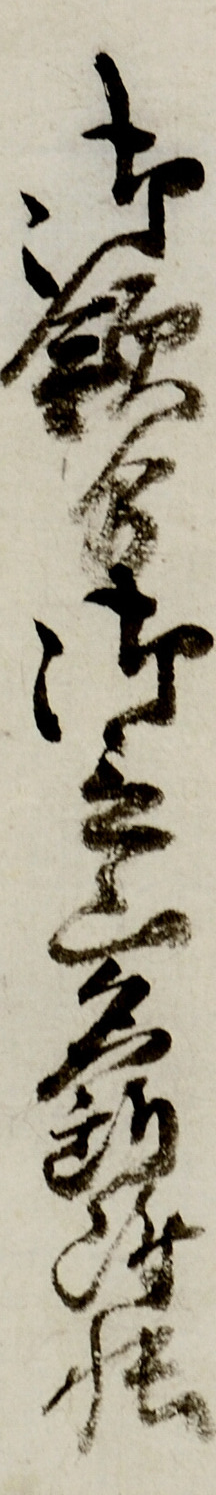御領分御立山名所附帳
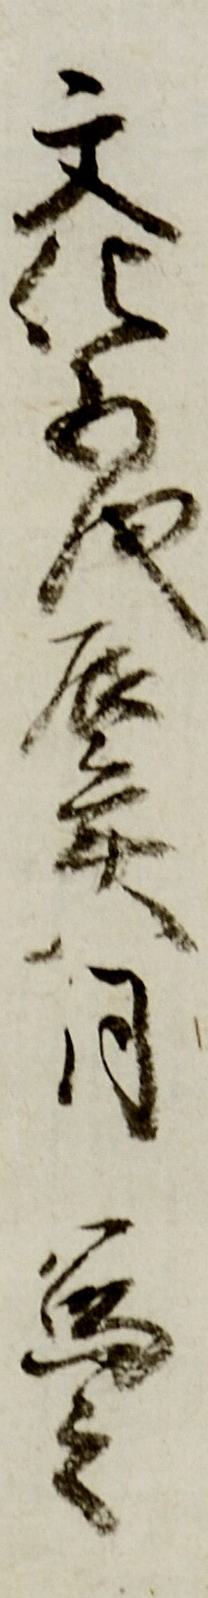文化五戊辰年八月写之

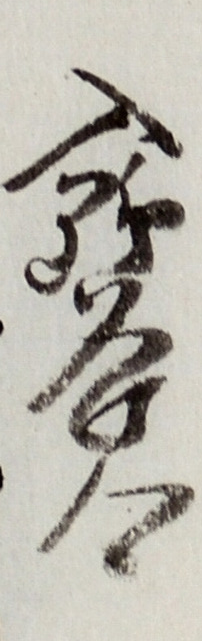入野谷郷
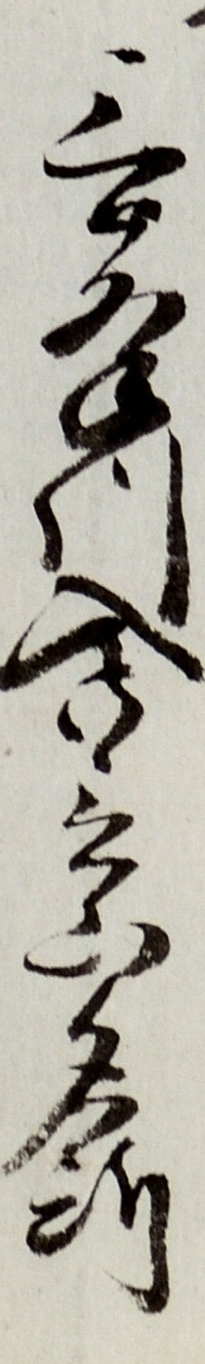三峯川入御立山名所

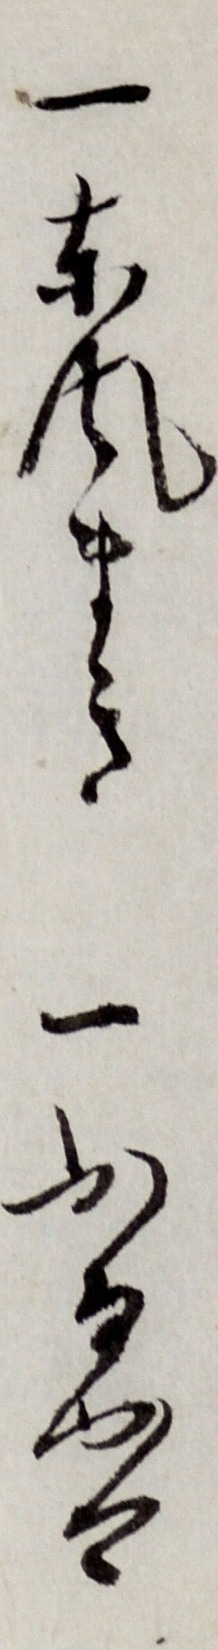一東風まき一かるかや
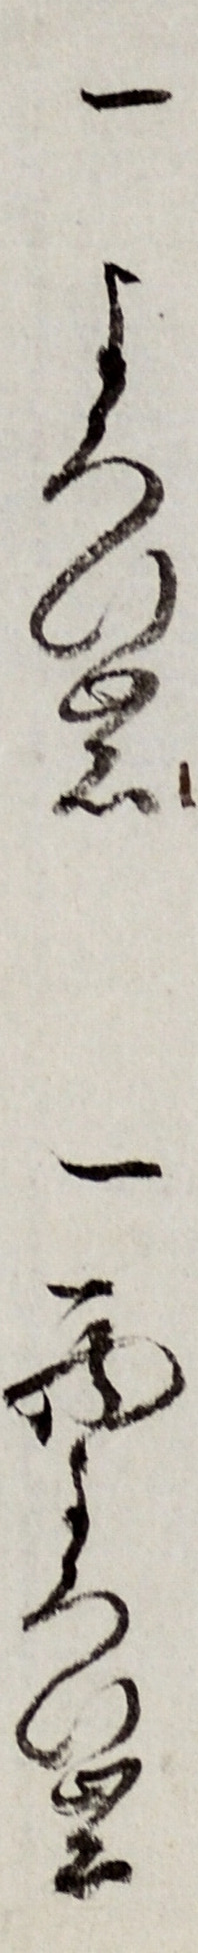一よろい岩一西よろい岩
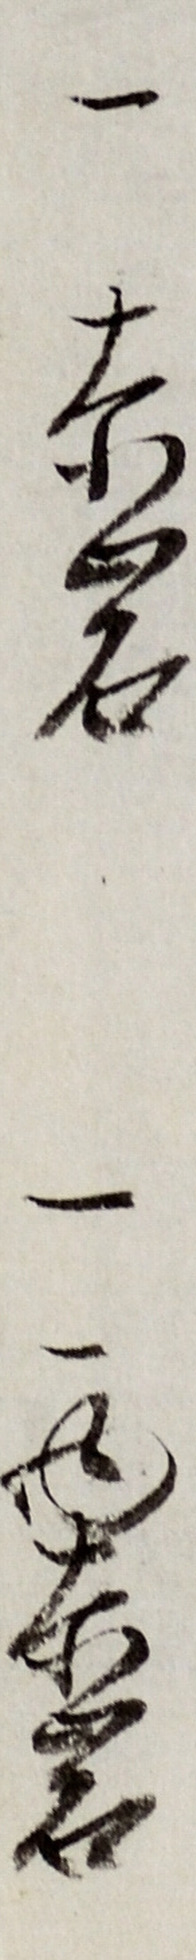一赤岩一西赤岩
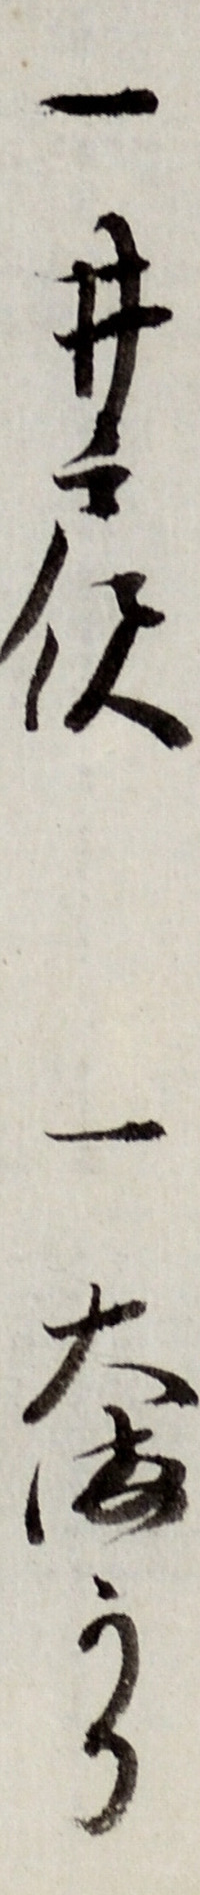一井戸沢一大まかり
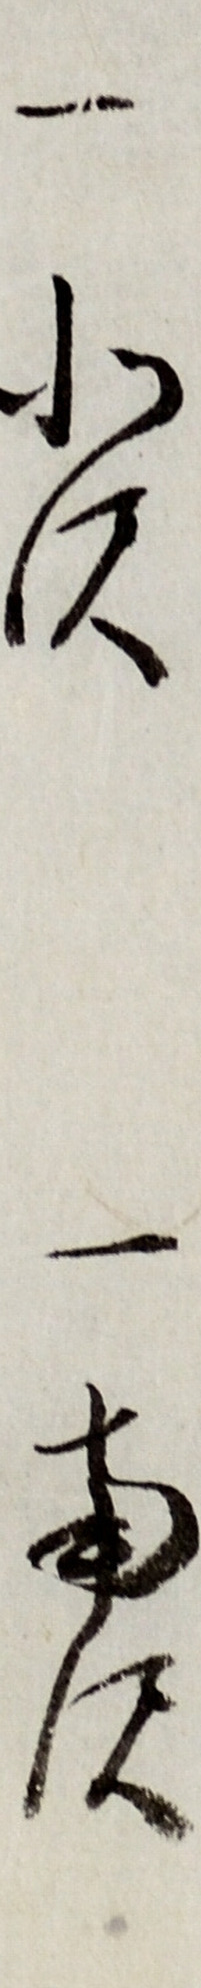一北沢一南沢
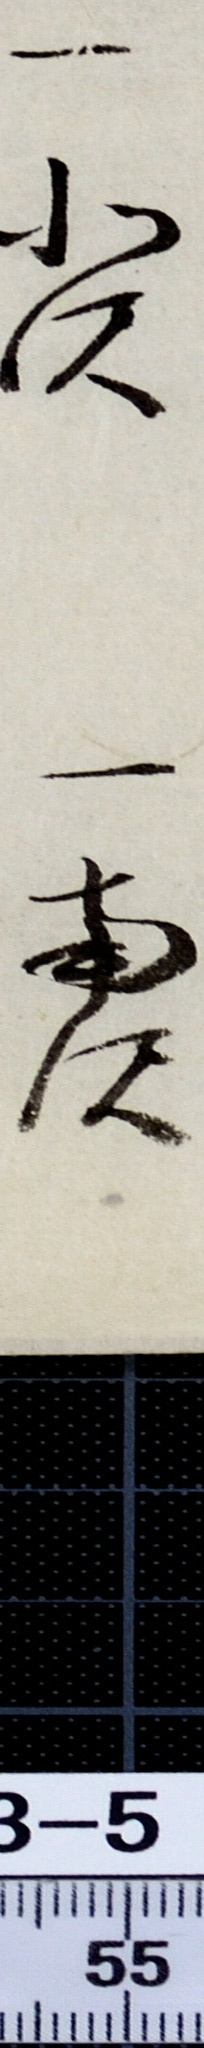一北沢一南沢
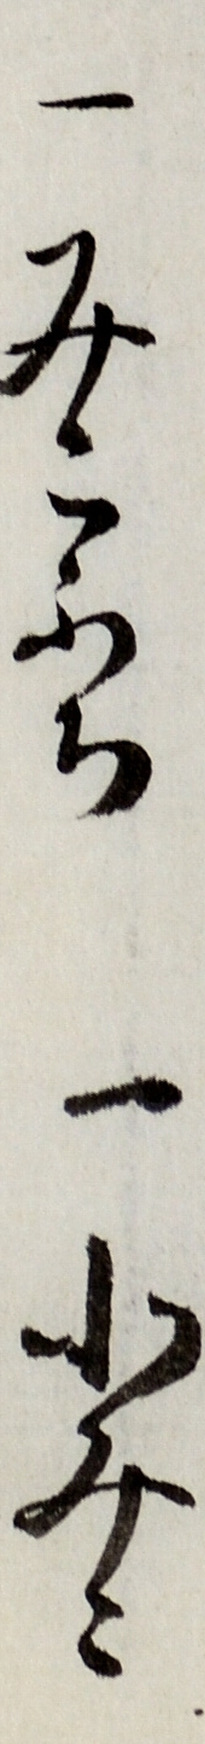一みこふち一北みこ
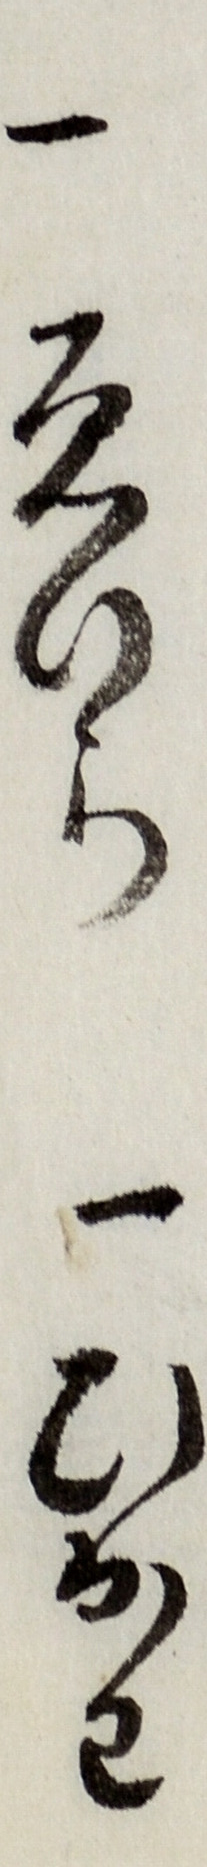一ゑいら一ひかわ
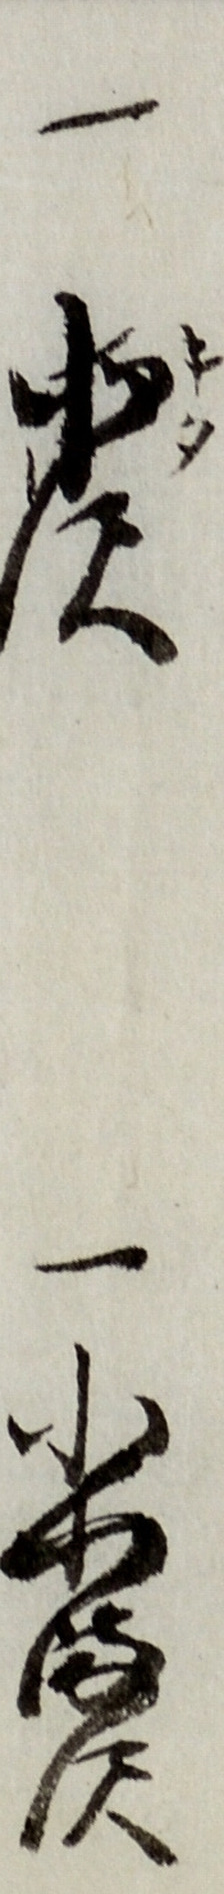一北沢一小くま沢
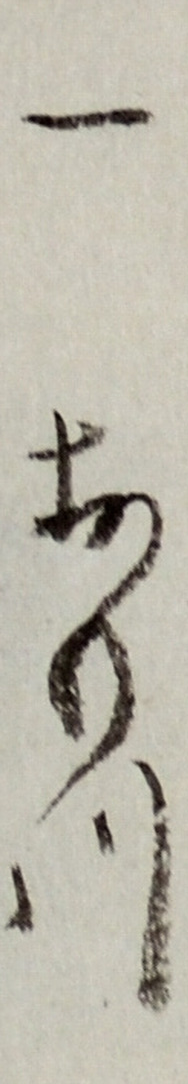一おり川
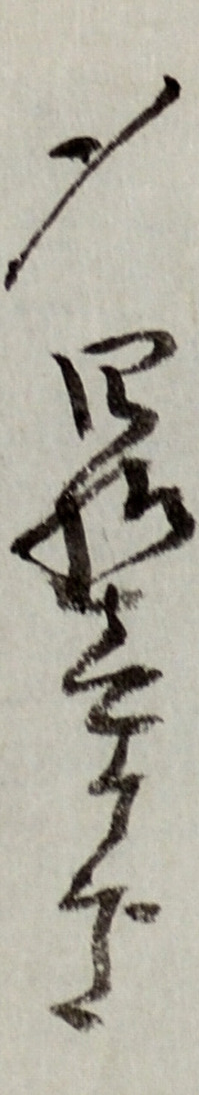〆四拾壱ケ処

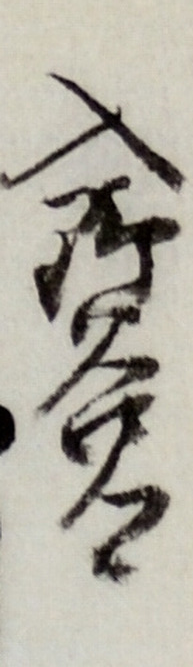入野谷郷
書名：御領分御立山名所附帳
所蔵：伊那市立高遠町図書館・合同会社AMANE
